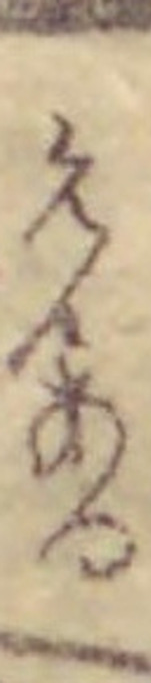えんある
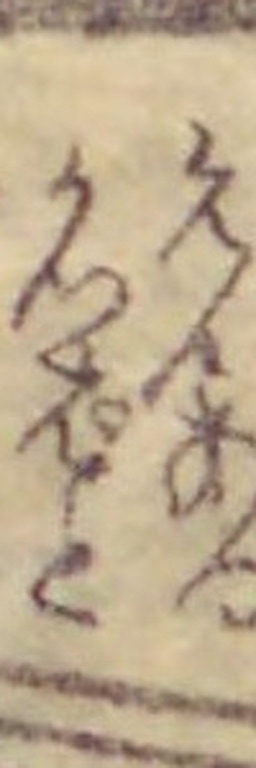かつぱと
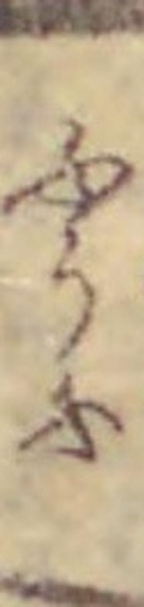ふうふ
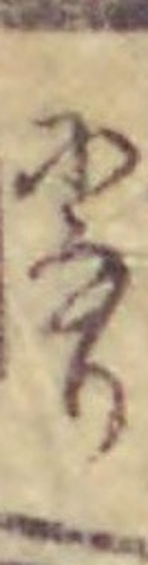になり

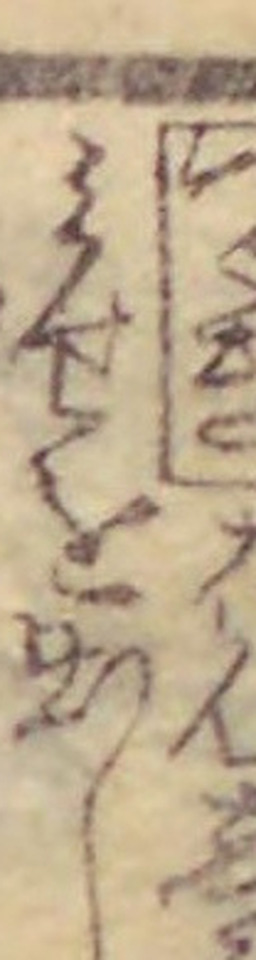みせを出し
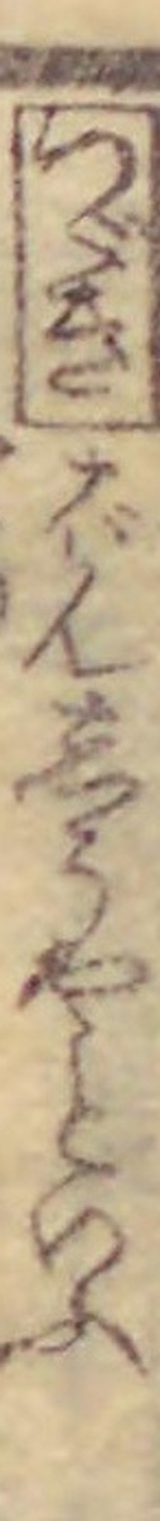つゞきばんしうやといふ
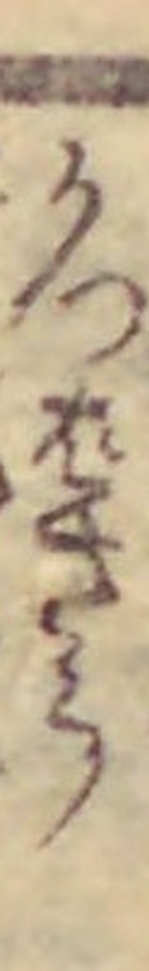かつぱさう
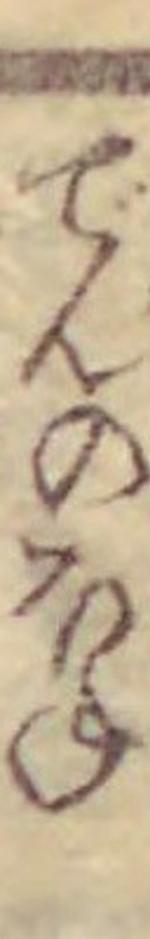でんのほね
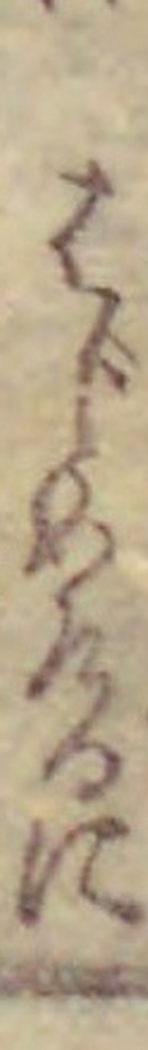はじめけるに
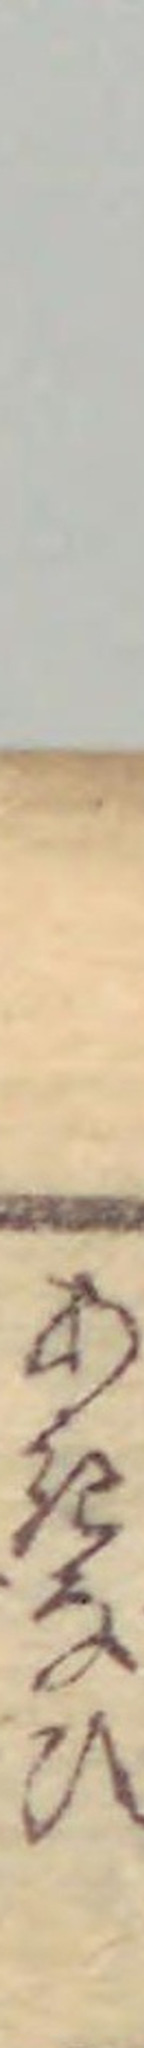あきなひ
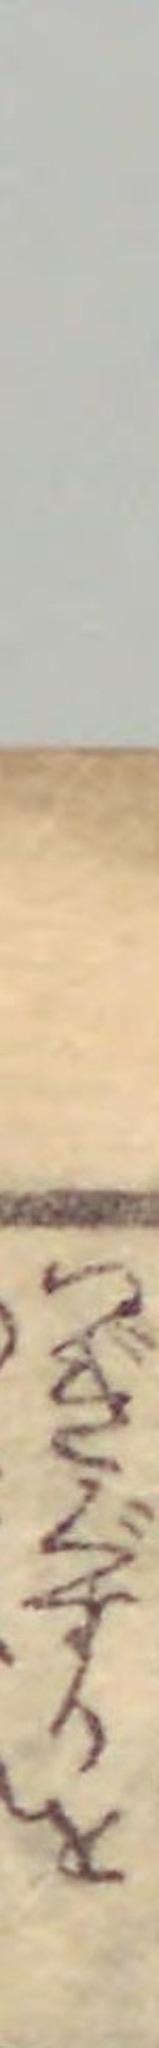つぎぐすりを
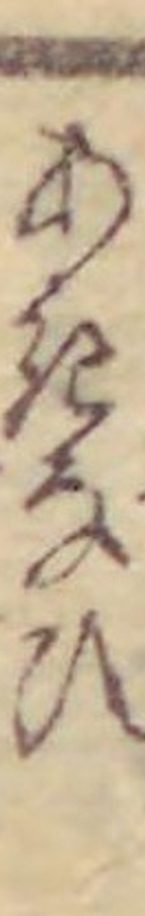あきなひ
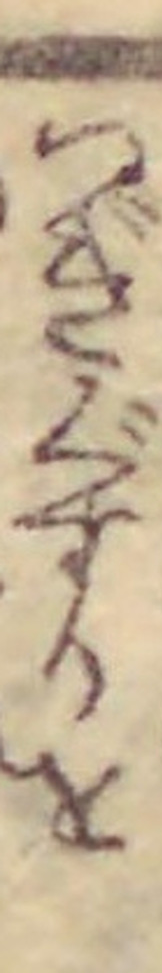つぎぐすりを
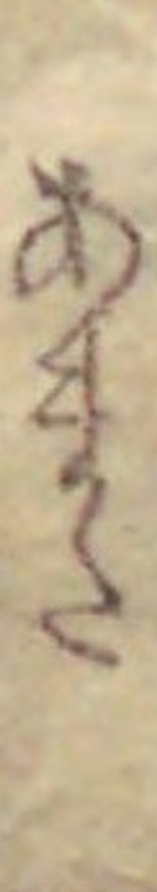あまた
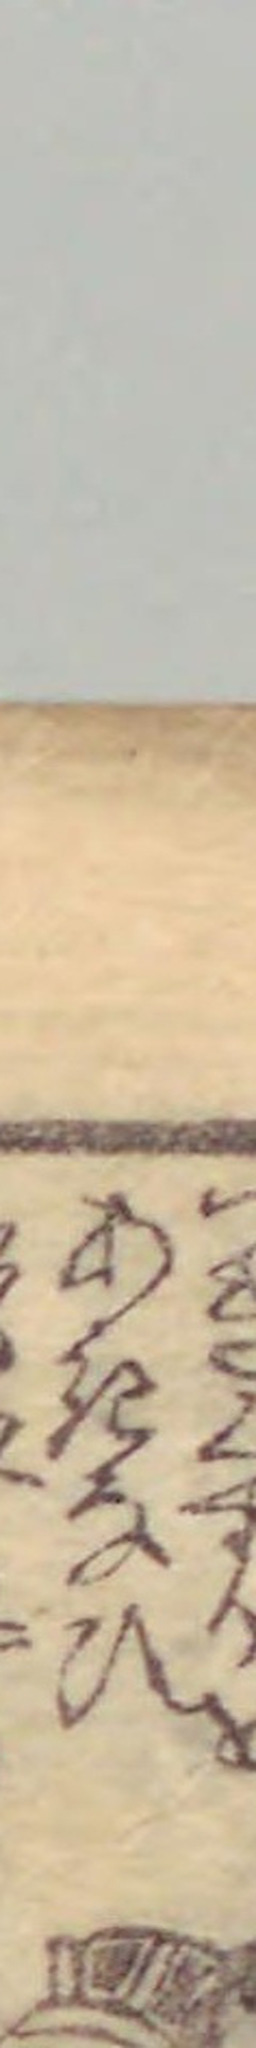あきなひ
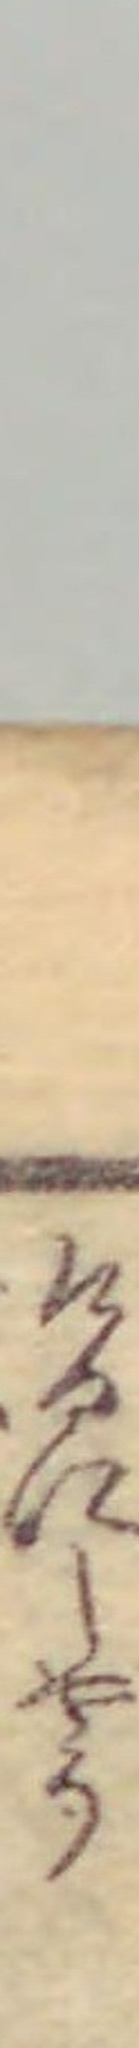けるにしやう
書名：化物世帯氣質
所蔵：国立国会図書館 National Diet Library, JAPAN
